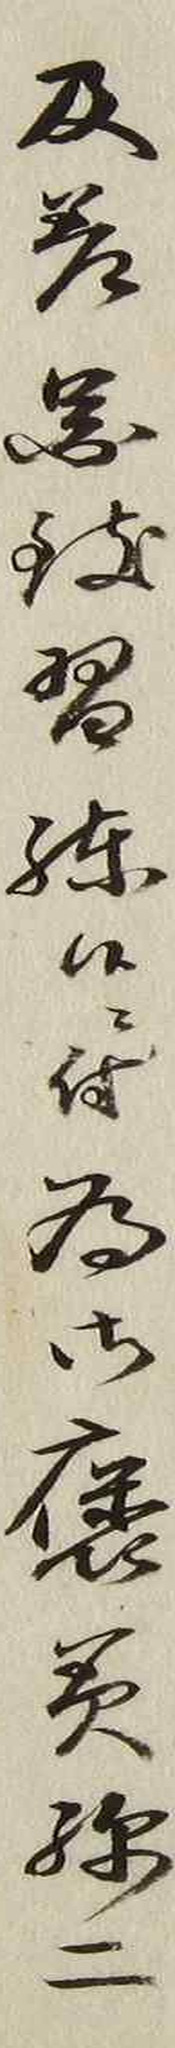及差図致習練候ニ付為御褒美綿二
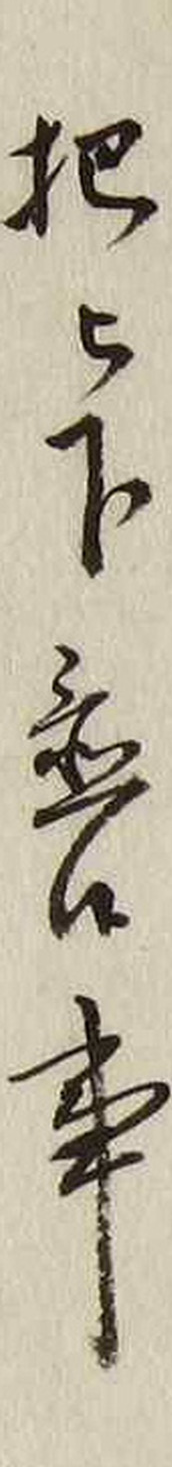把被下置候事
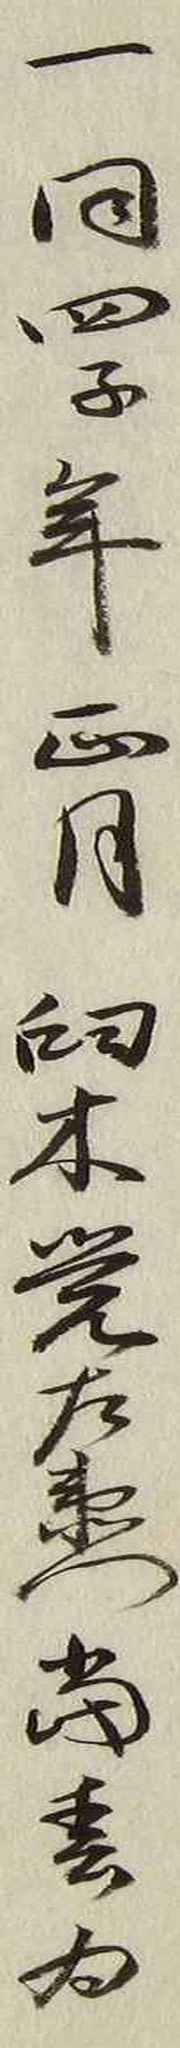一同四子年正月臼木覚左衛門当春為
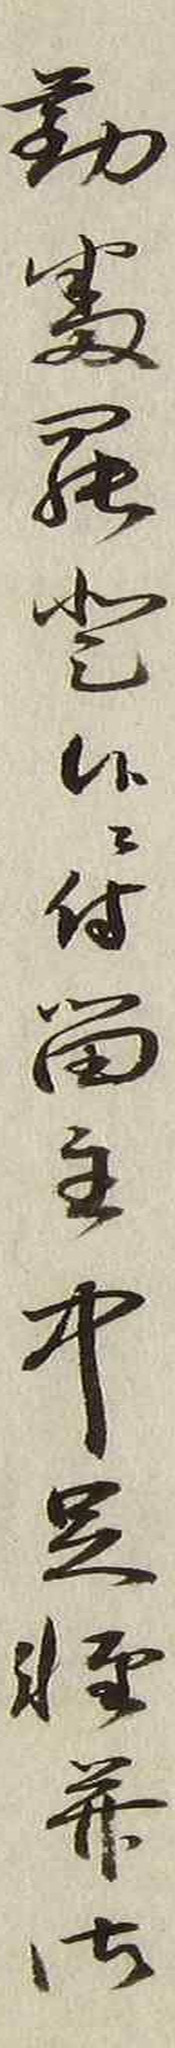勤番罷登候ニ付留主中足軽并御
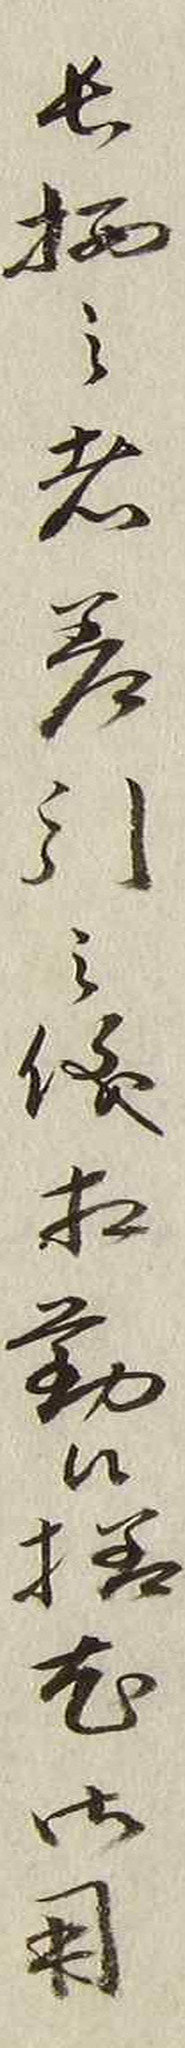長柄之者差引之儀相勤候様尤御用
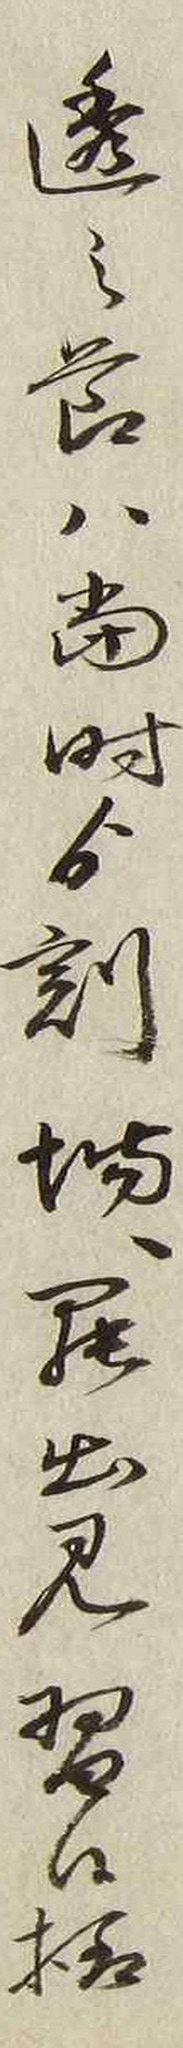透之節は当時ゟ刻場へ罷出見習候様

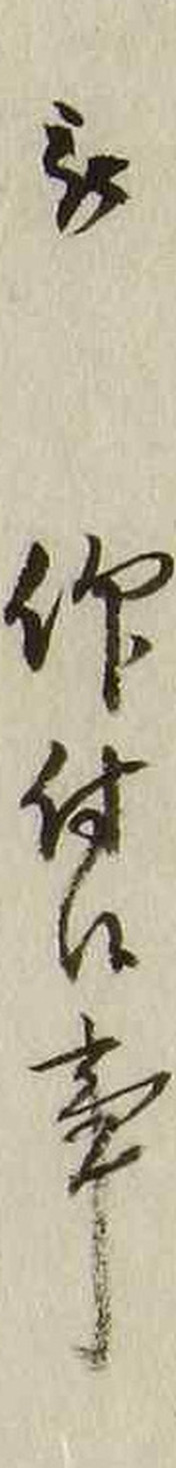被仰付候事
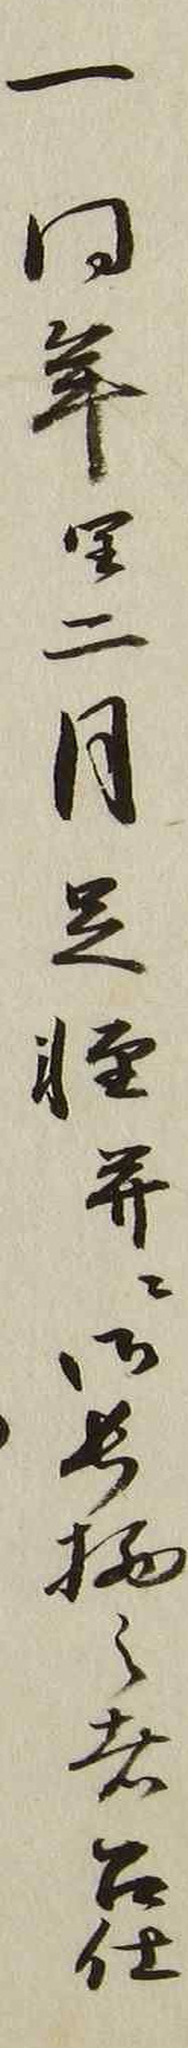一同年閏二月足軽并ニ御長柄之者召仕
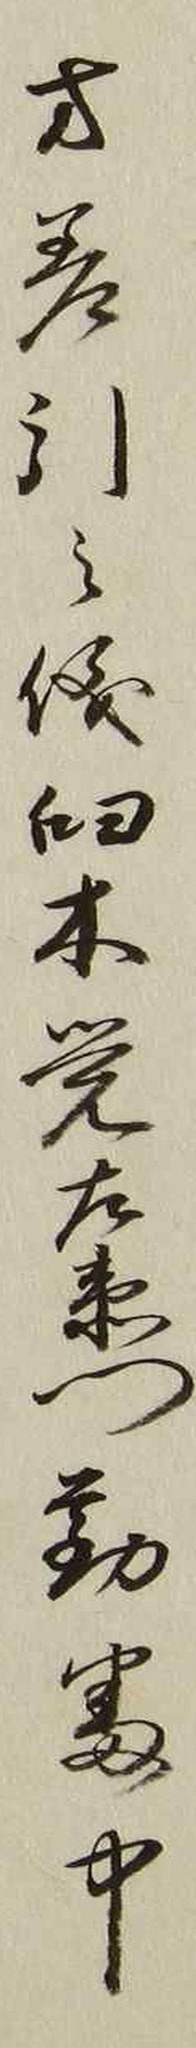方差引之儀臼木覚左衛門勤番中
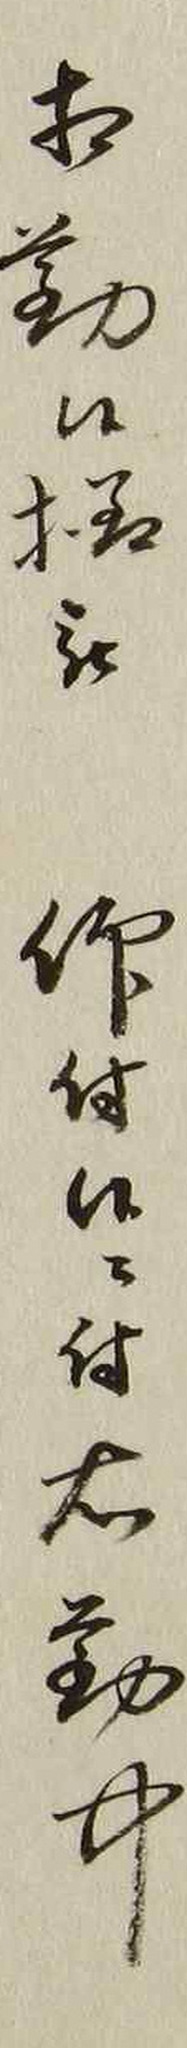相勤候様被仰付候ニ付右勤中
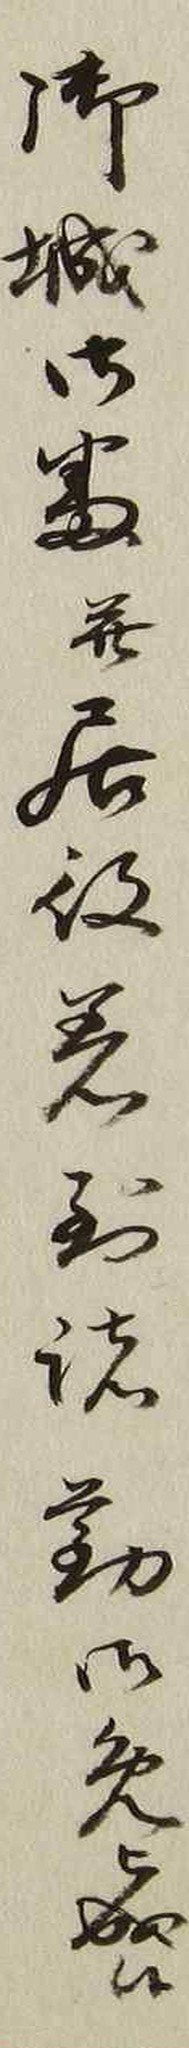御城御番并居役着到諸勤御免被成候
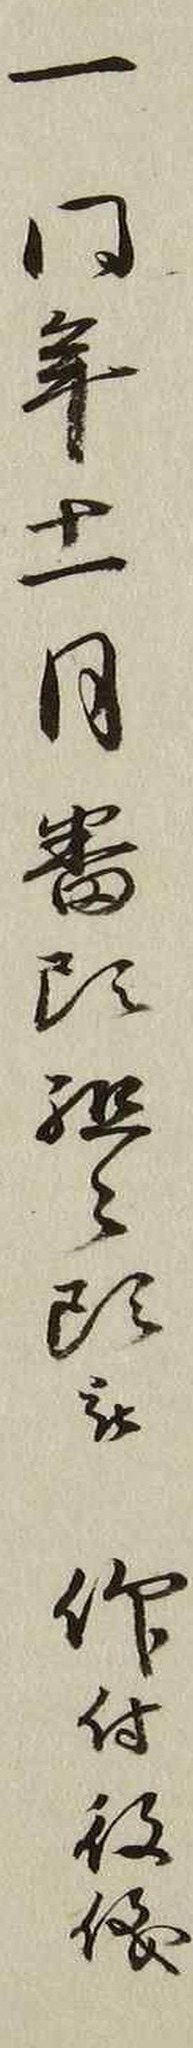一同年十一月番頭組ニ頭被仰付役儀
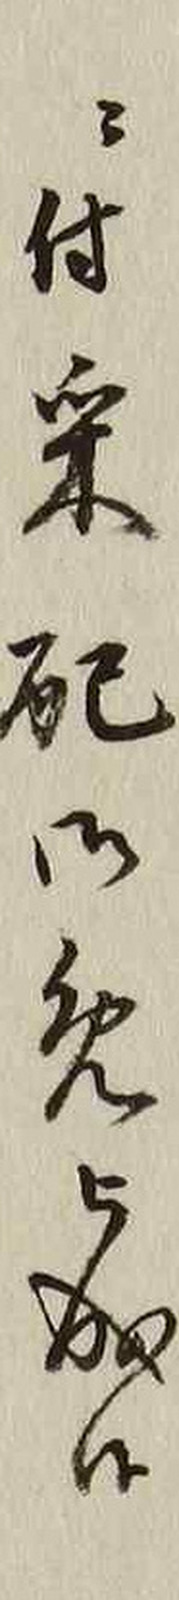ニ付采配御免被成候
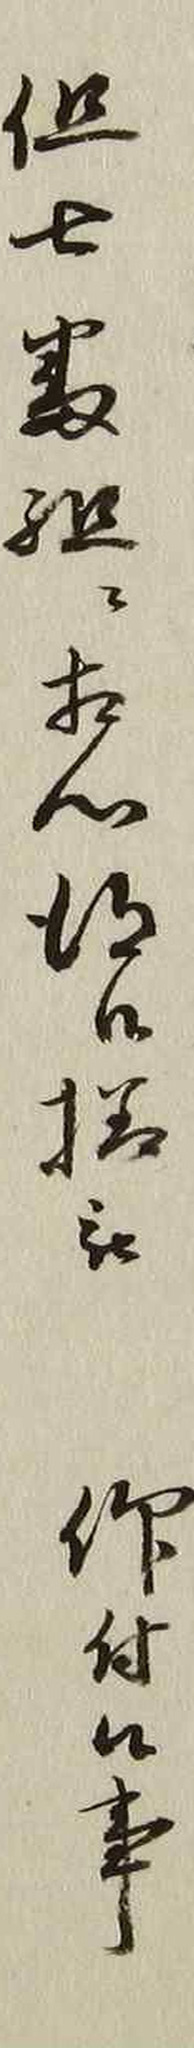但七番組ニ相心得候様被仰付候事
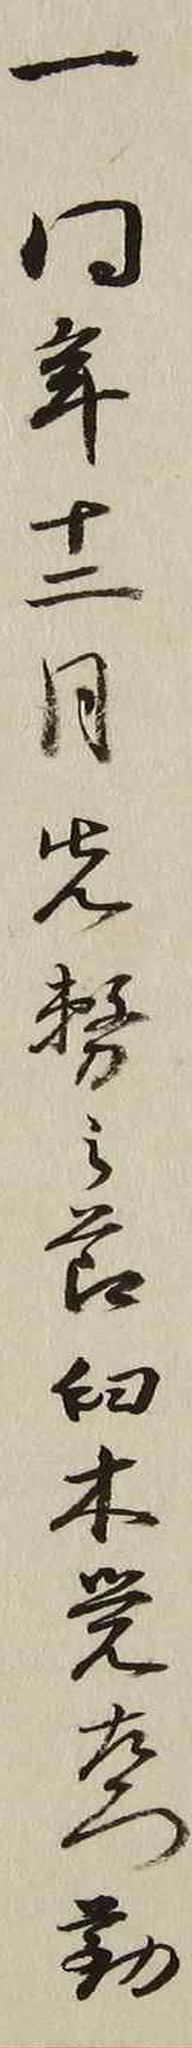一同年十二月先務之節臼木覚左衛門勤
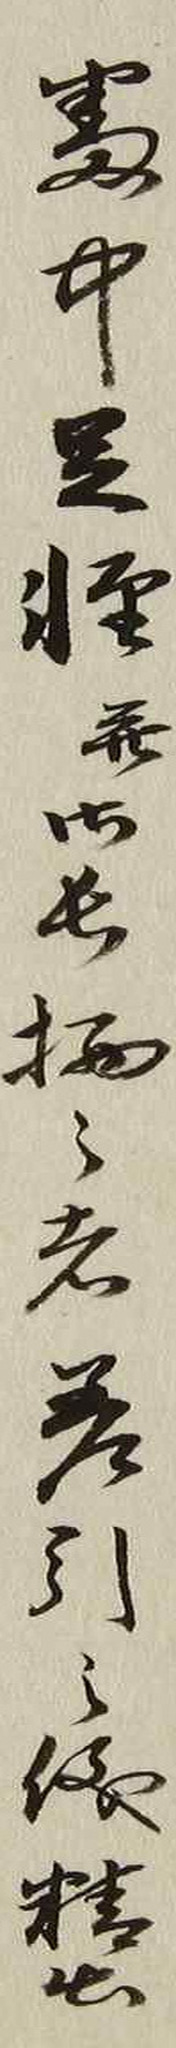番中足軽并御長柄之者差引之儀精出
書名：諸士系譜　巻之160　な之部2
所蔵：会津若松市立会津図書館
